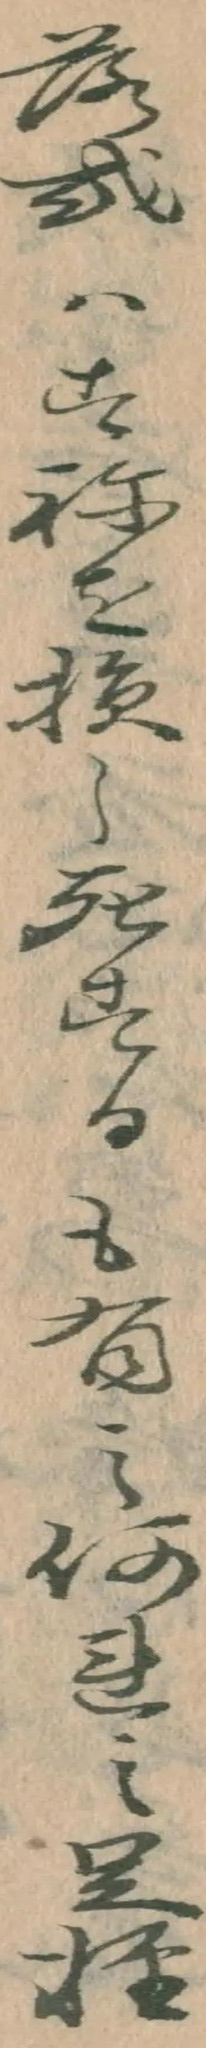落或は春祢を損し死春るも有之何連之足軽
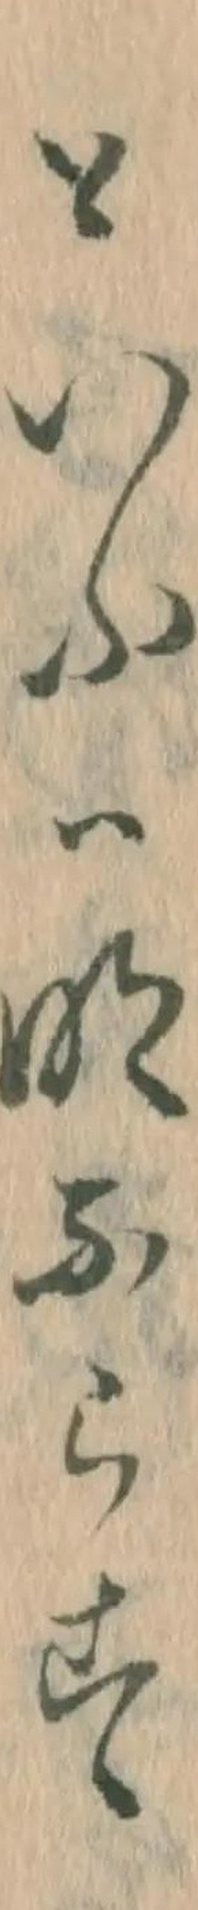といふは明なら春
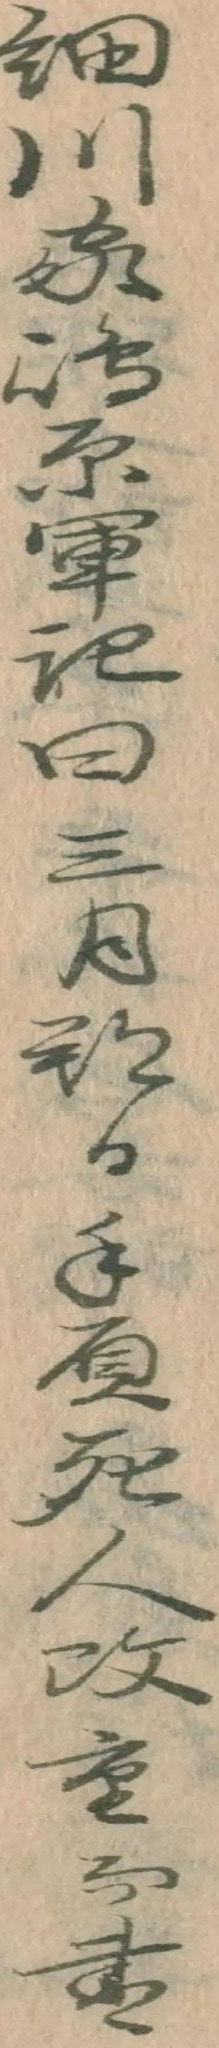細川家島原軍記曰三月朔日手負死人改重而書
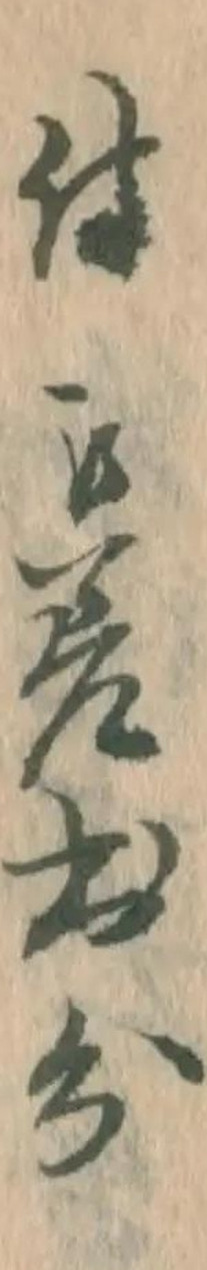付被差出分
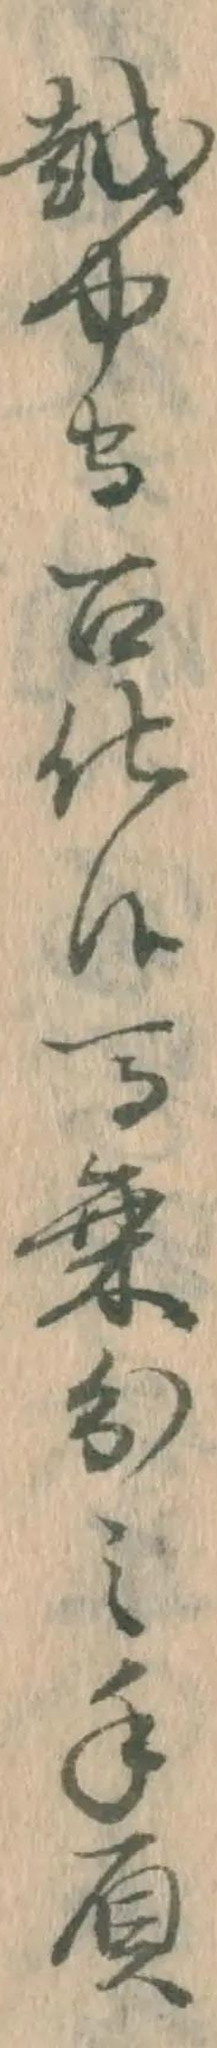越中守召仕候馬乗分之手負
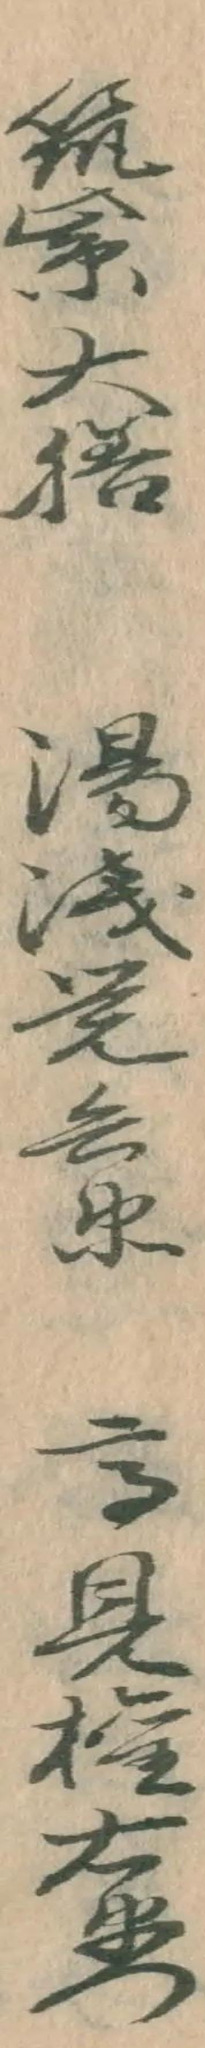筑紫大膳湯浅覚兵衛高見権右衛門
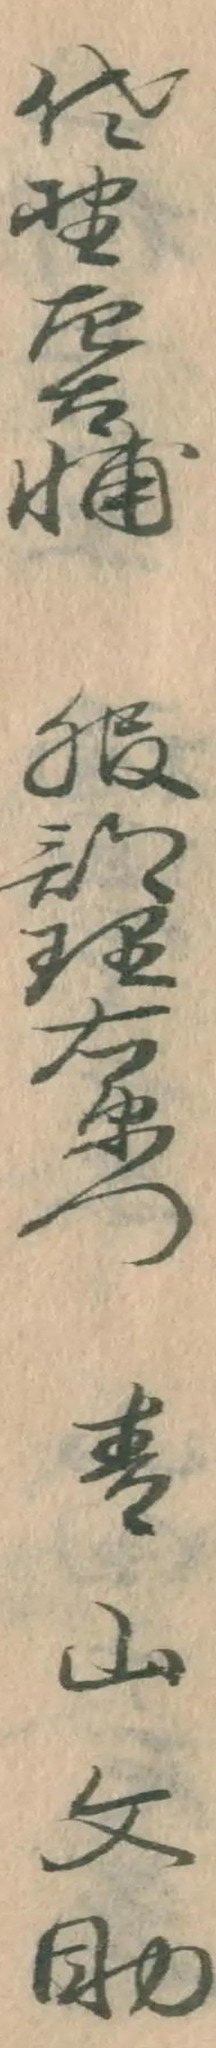佐野左太輔服部理右衛門青山文助

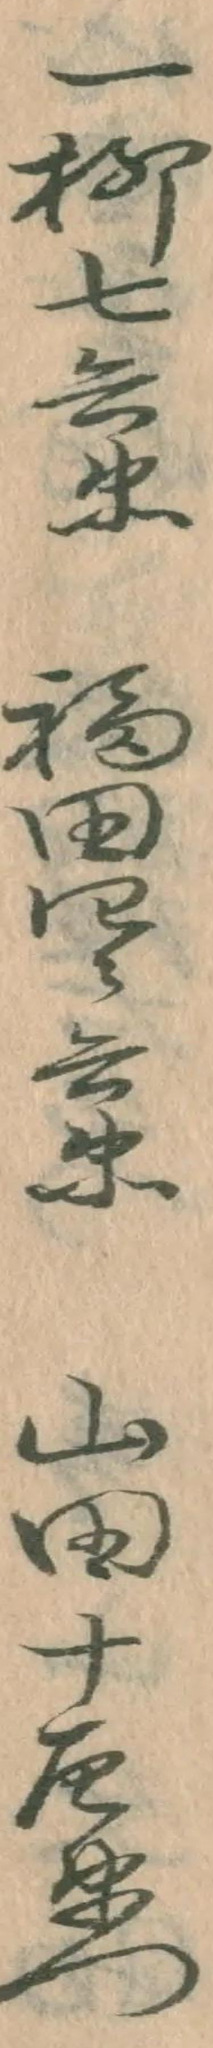一柳七兵衛福田四郎兵衛山田十左衛門
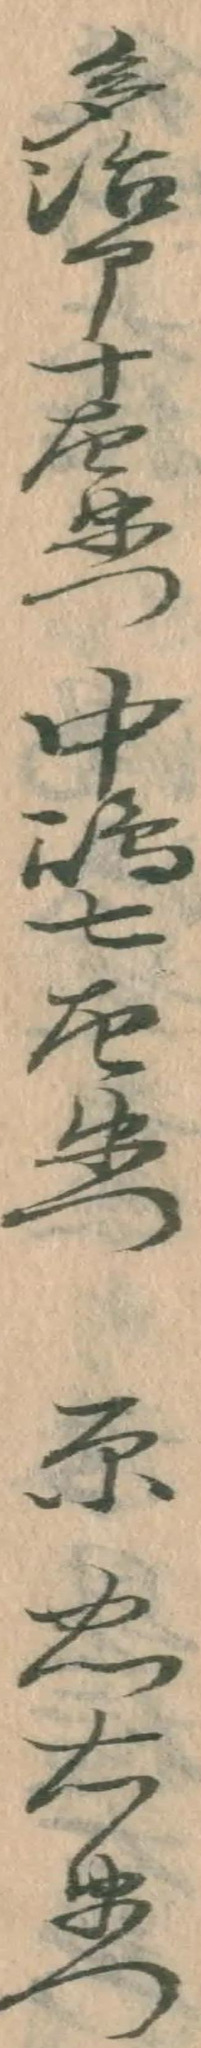多治部十左衛門中島七左衛門原忠右衛門
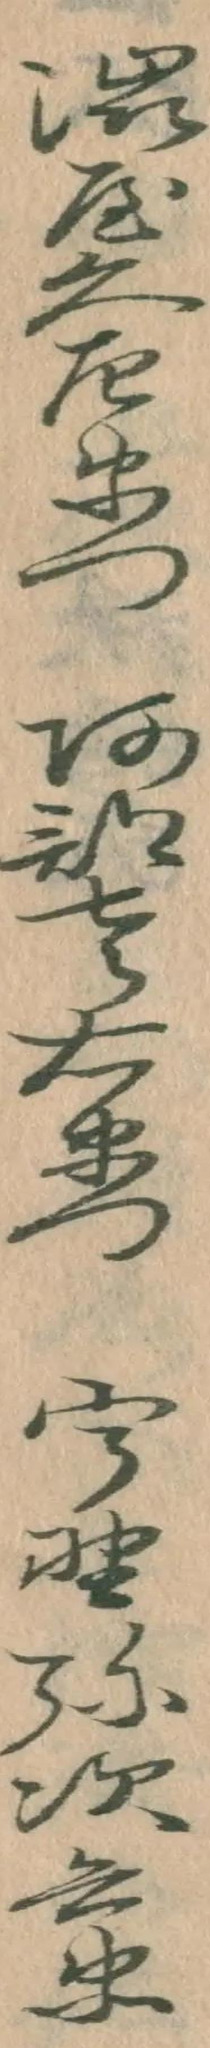渋屋久左衛門河部七郎右衛門宇野弥次兵衛
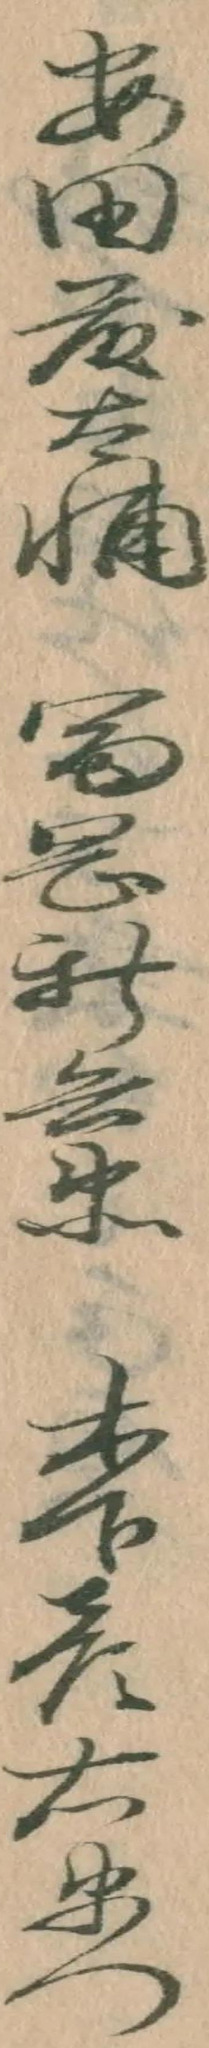安田藤太輔冨岡新兵衛木下彦右衛門
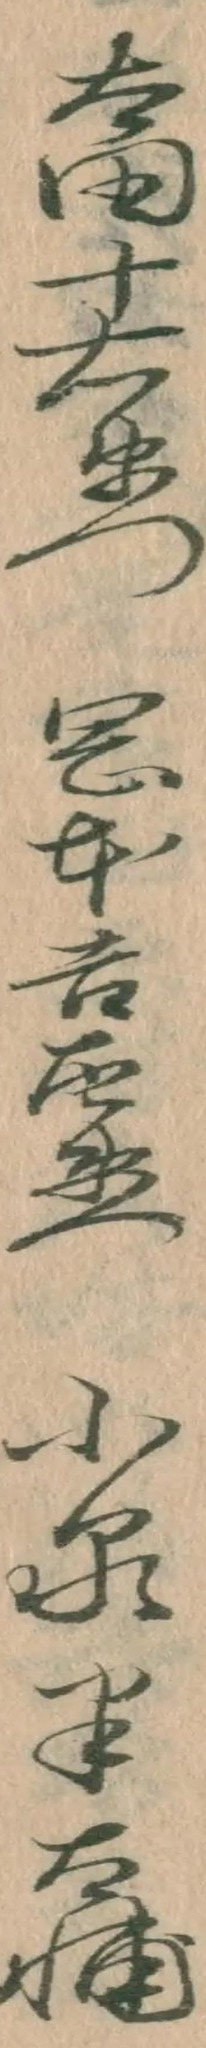太田十右衛門岡本吉左衛門小泉半太輔
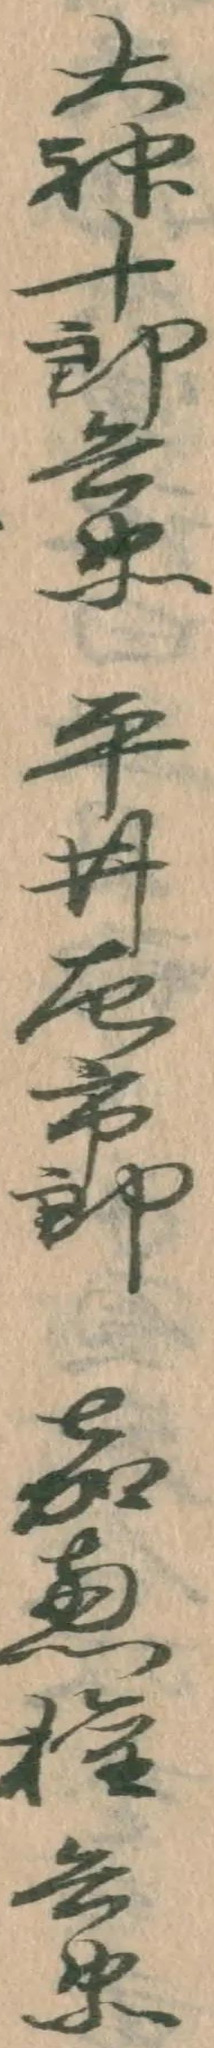大神十郎兵衛平井左市郎嘉恵権兵衛
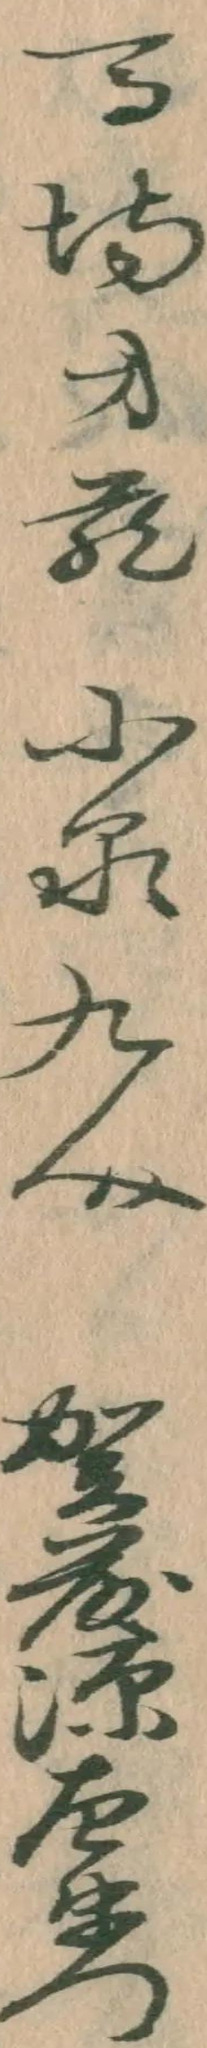馬場才蔵小泉九介賀藤源左衛門
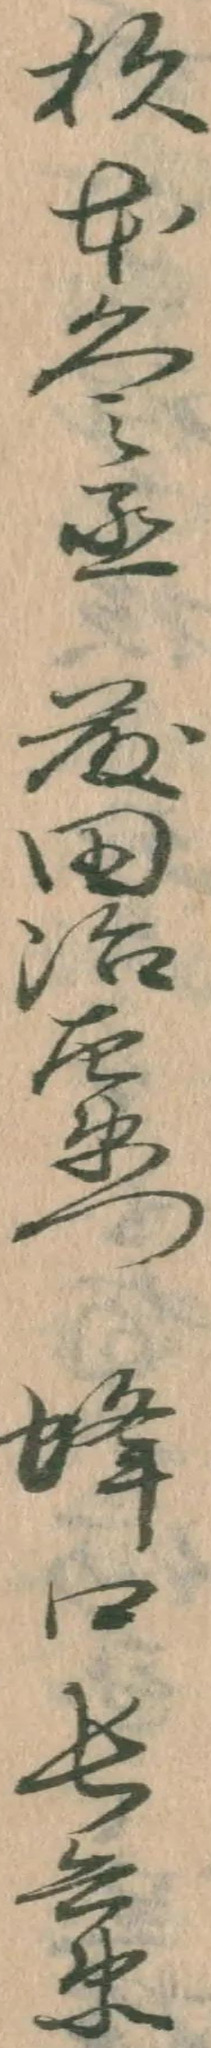杉本久之丞藤田治左衛門蜂口長兵衛
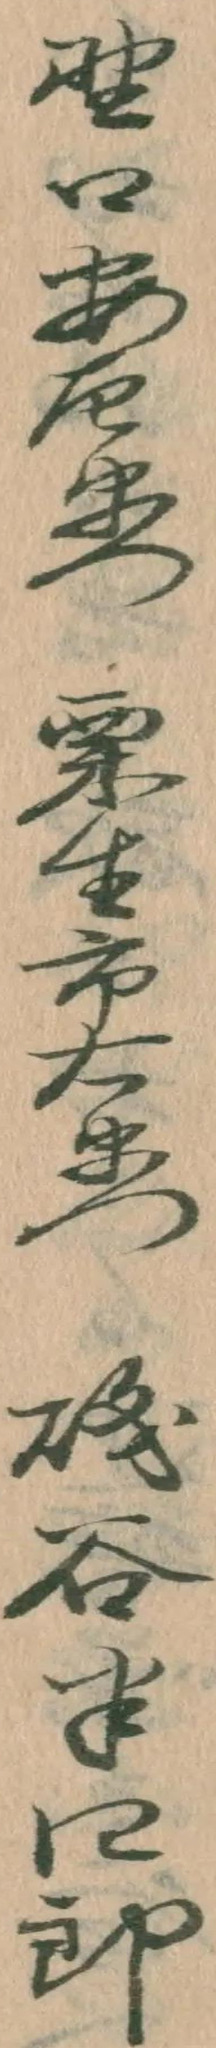野口安左衛門栗生市右衛門磯谷半四郎
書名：切支丹御退治記 49巻. [9]
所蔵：国立国会図書館 National Diet Library, JAPAN
